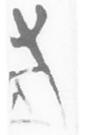○（右）
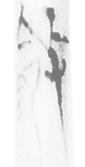○（令）
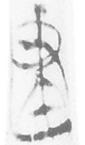建
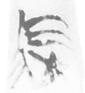馭（御）
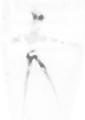大
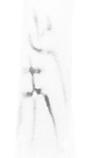○（旆）
